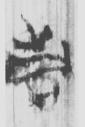青
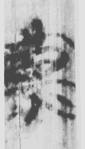黃
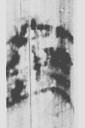金
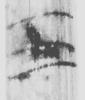玉
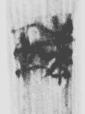珠
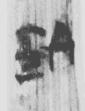{王夂}
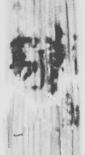璿
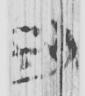{王刃}
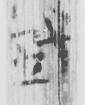{王弋}
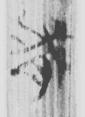歲
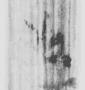至
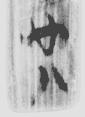{廿八}
